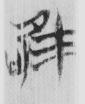唯
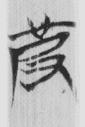皮
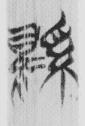{鳥爪糸}
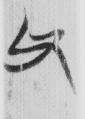父
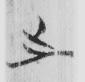之
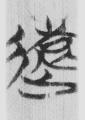遠
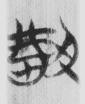{刱田}
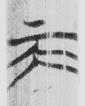天
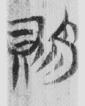賜
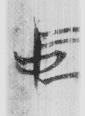𠁩
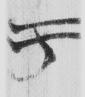于
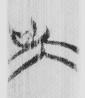吳
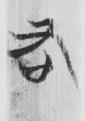右
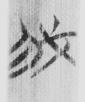我
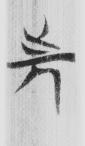先
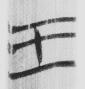王
